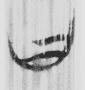曰
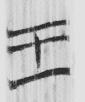王
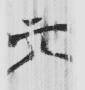亓
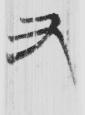又
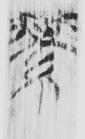縈
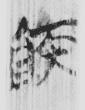疾
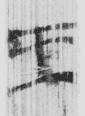王
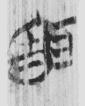䎽
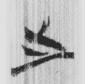之
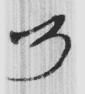乃
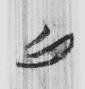㠯（以）
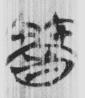{竹亯}
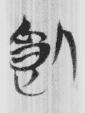飤
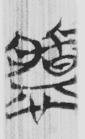{脂皿}
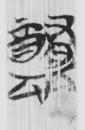{酉有皿}
